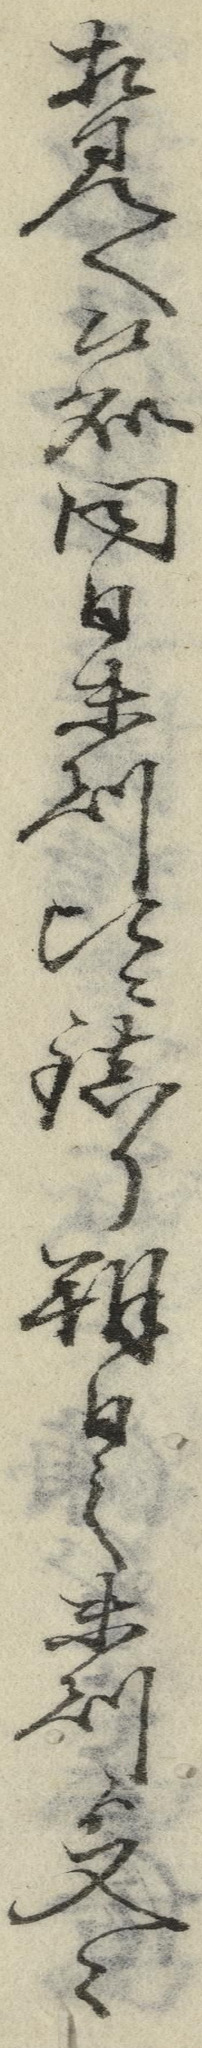相見へ候処同日未刻頃ニ鎮り朔日之未刻ゟ又々
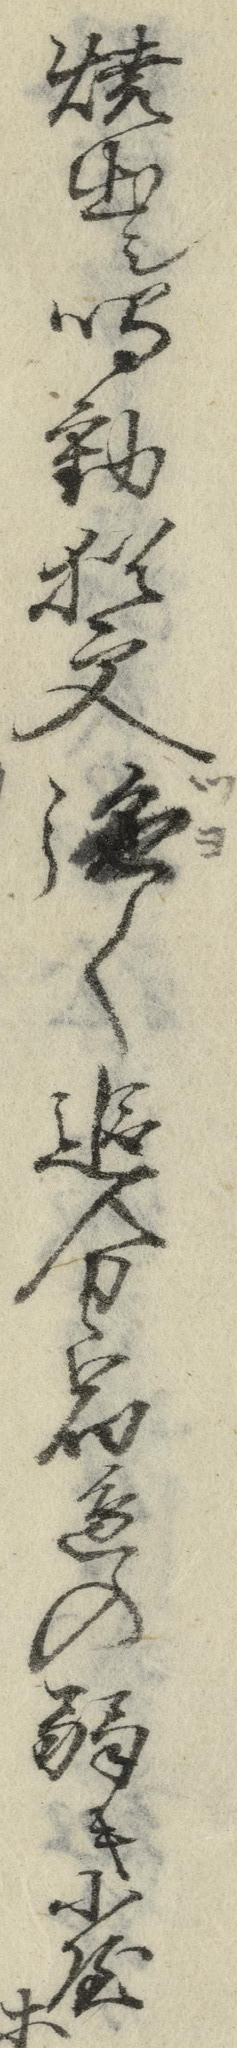焼出シ鳴動猶更強く追分宿辺の弱キ小屋等
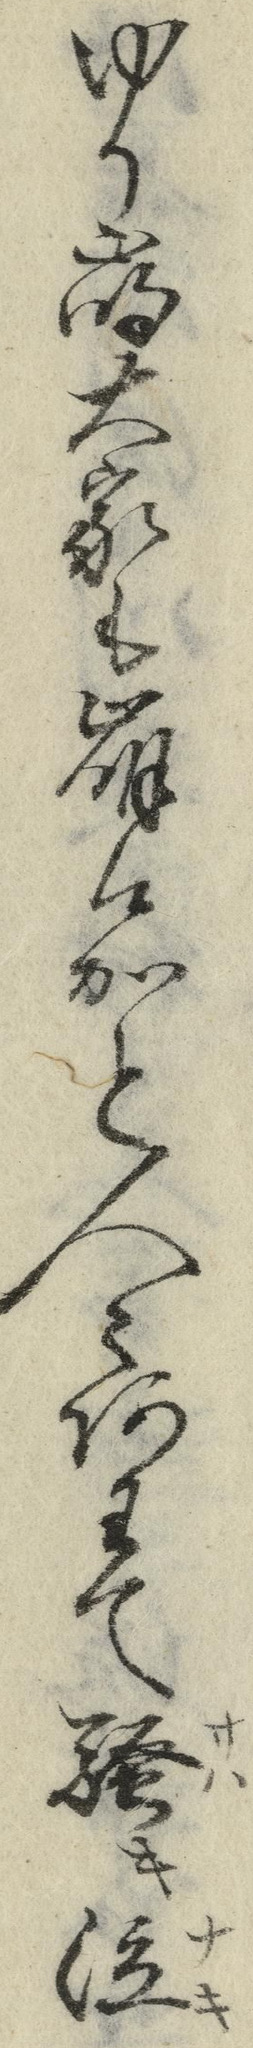ゆり崩大家も崩候かと人々あわて騒キ泣
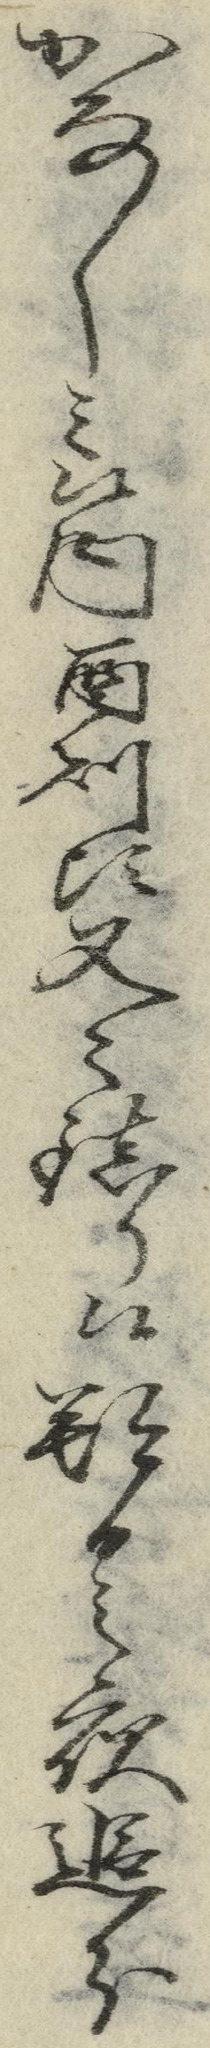かなしミ候内酉刻頃又々鎮り候朔日之夜追分
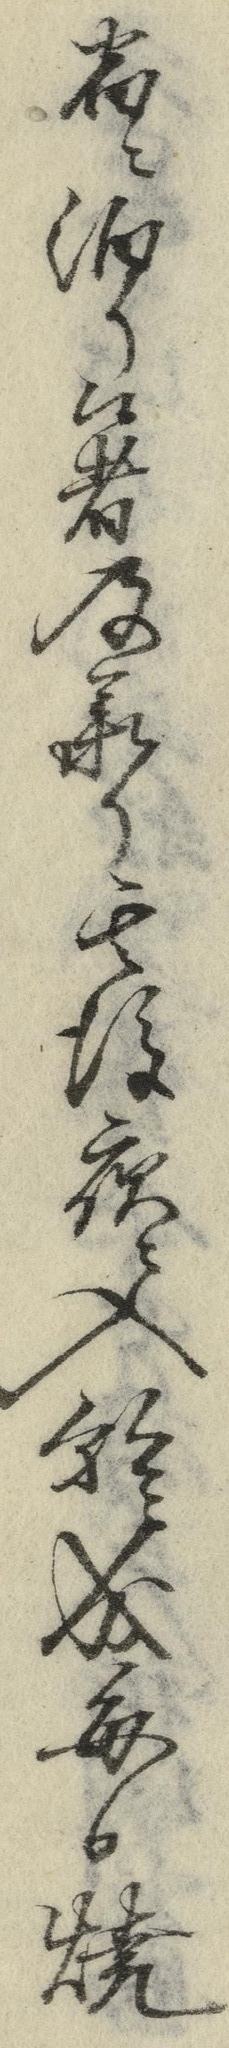宿ニ泊り候者及承り其後夜ニ入朝ニ成毎日焼
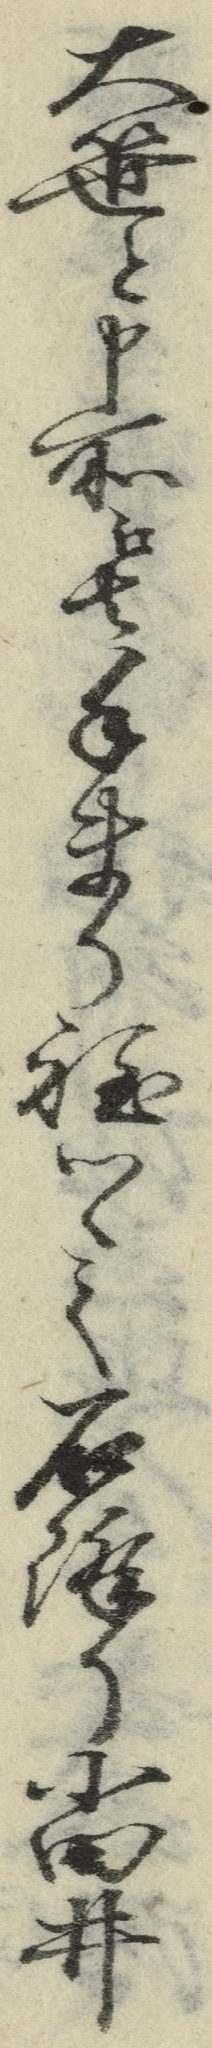大笹と申所江は手まり程ツゝ之石降り小田井
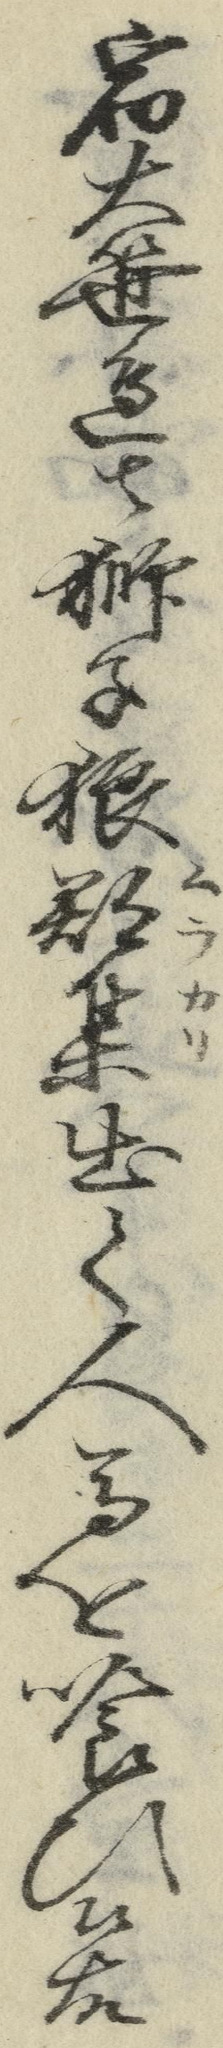宿大笹辺は獅子狼郡集出て人馬を喰ひ候故
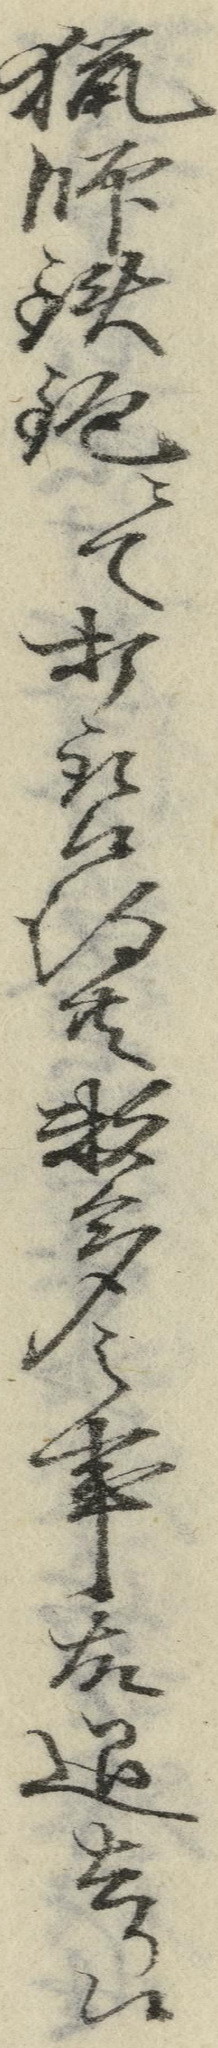猟師鉄砲ニて打取候得共数多之事故退去り候
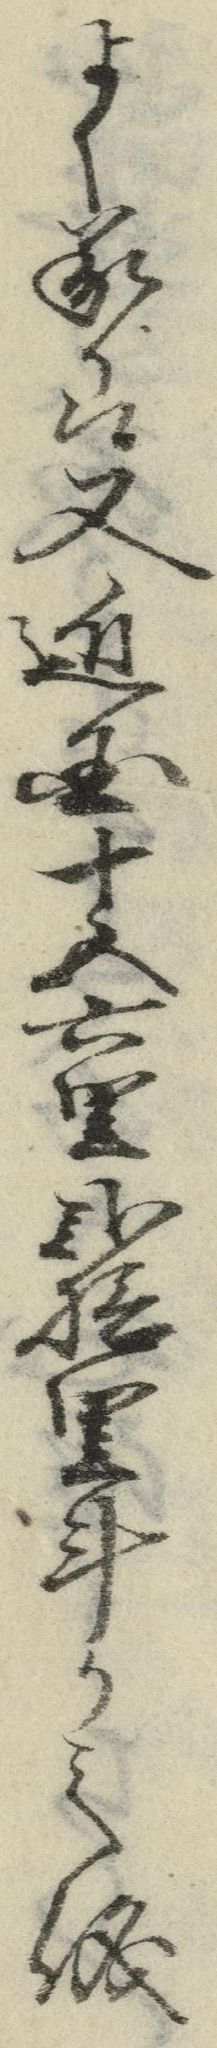よし承り候又近国十五六里弐拾里斗り之儀
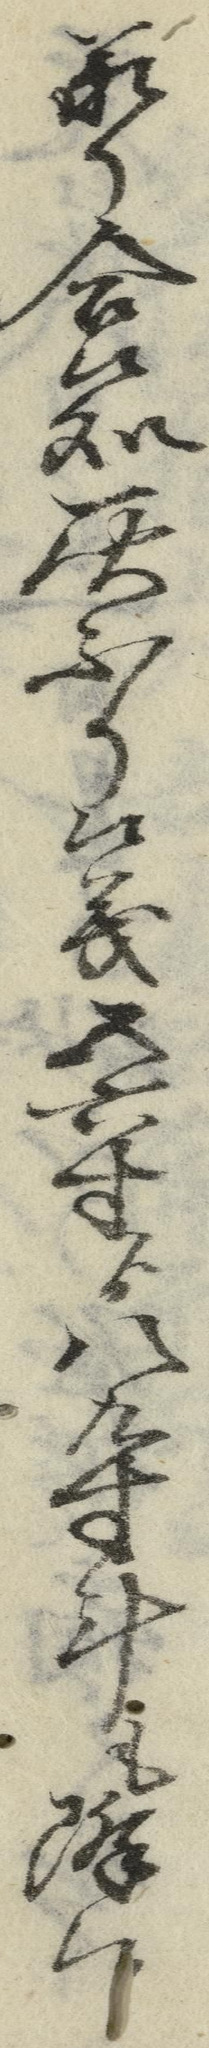承り合候処灰ふり候義五六寸ゟ八九寸斗も降候
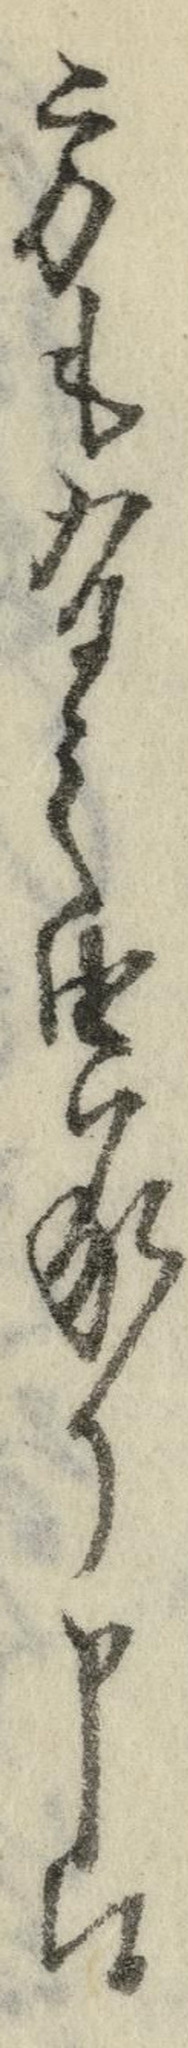方も有之由承り申候
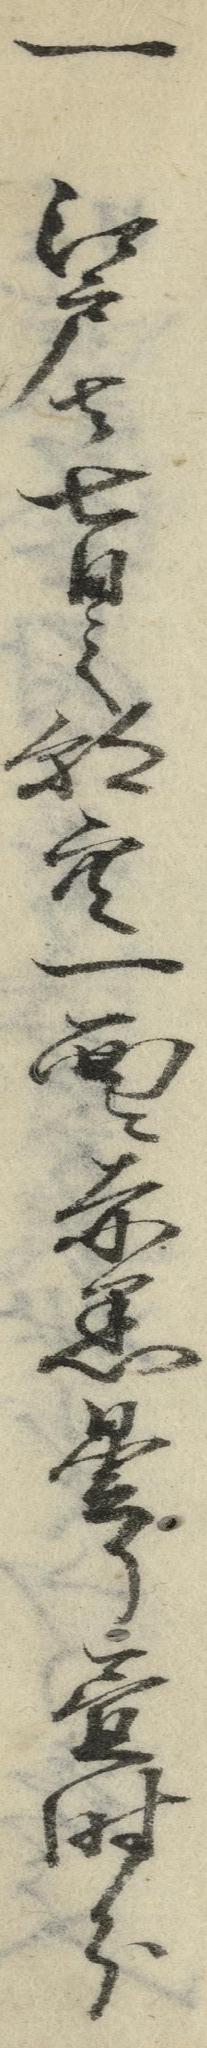一江戸は七日之朝空一面ニ赤黒曇り昼時分

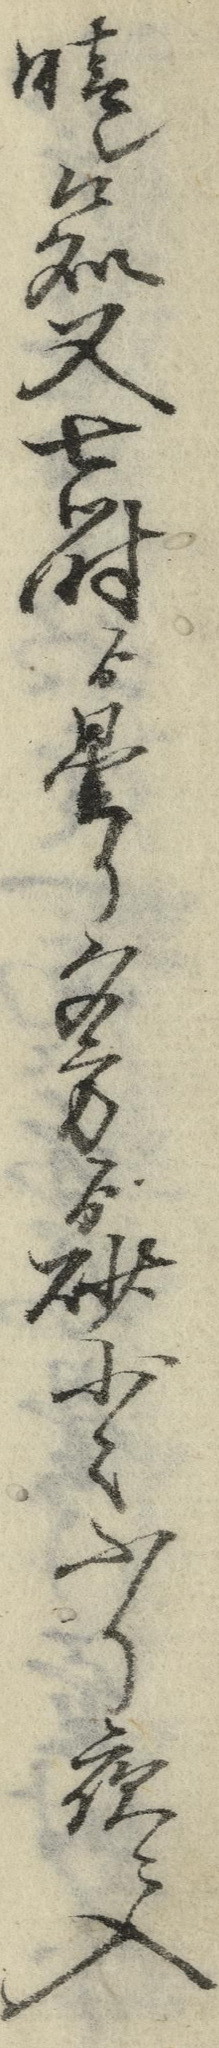晴レ候処又七ツ時ゟ曇り夕方ゟ砂少々ふり夜ニ入
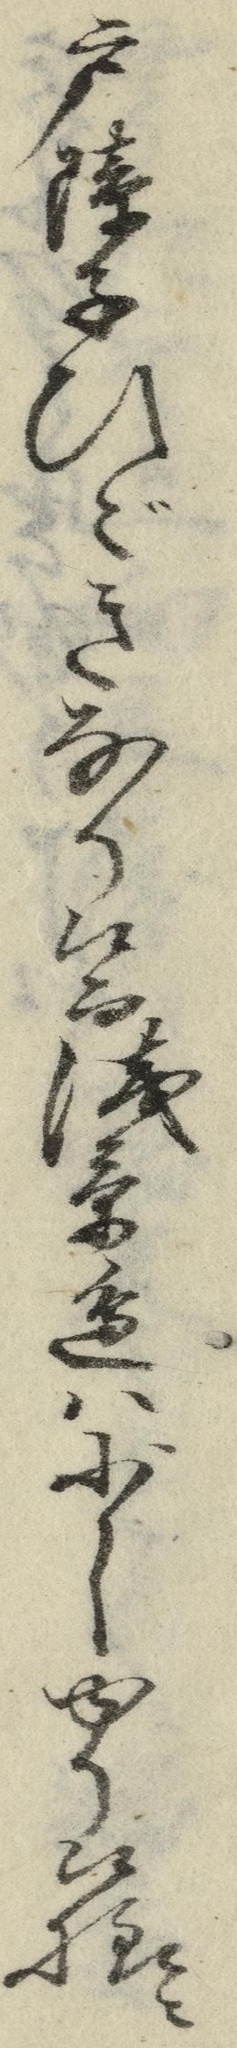戸障子ひゞきなり候而浅草辺ハ少しゆり候様ニ
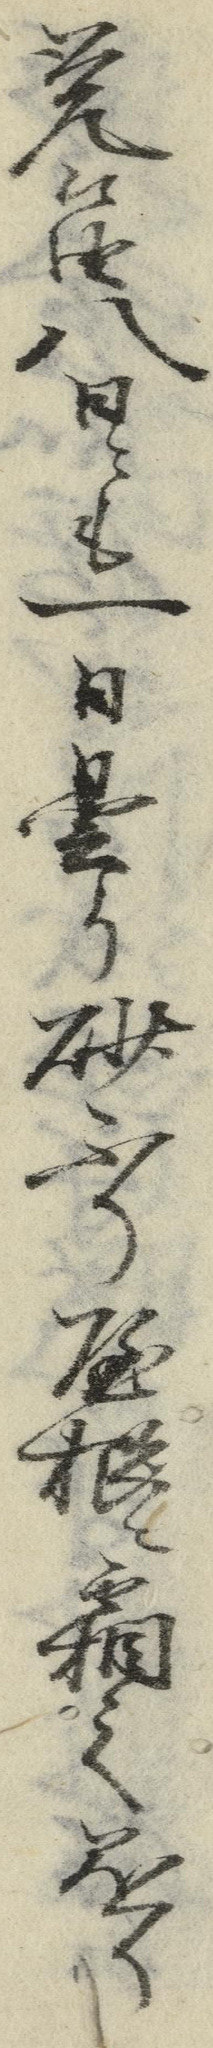覚候由八日ニも一日曇り砂ふり屋根ニ霜之懸り
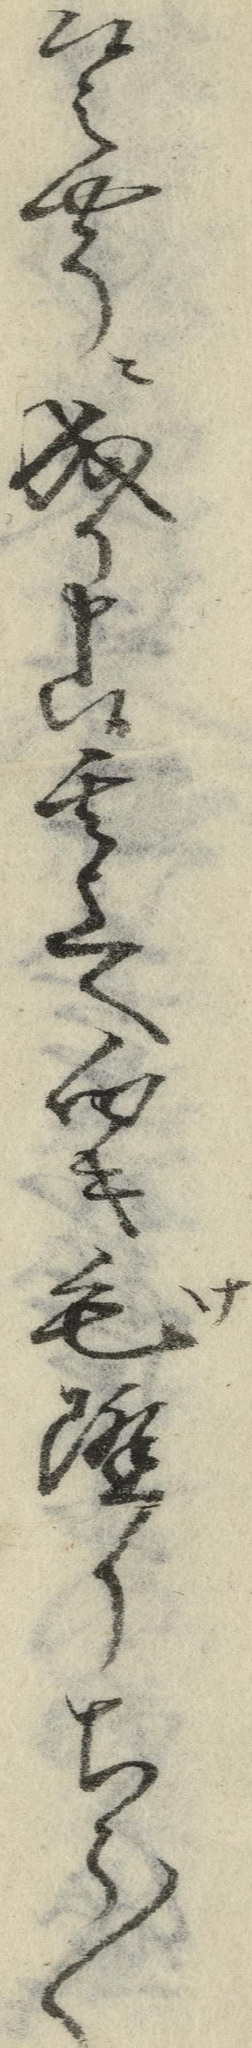候之やうニ成り申候其上へ白キ毛降りちら〳〵
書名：信州浅間山焼
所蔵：東京大学地震研究所図書室 Earthquake Research Institute Library, The University of Tokyo, JAPAN
